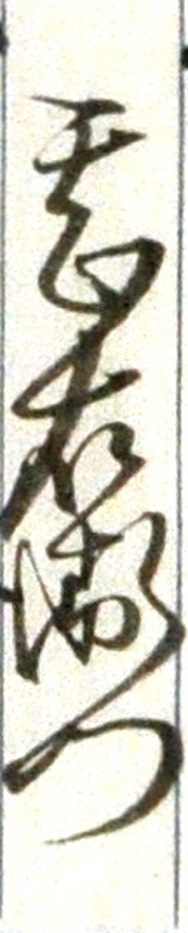甚右衛門
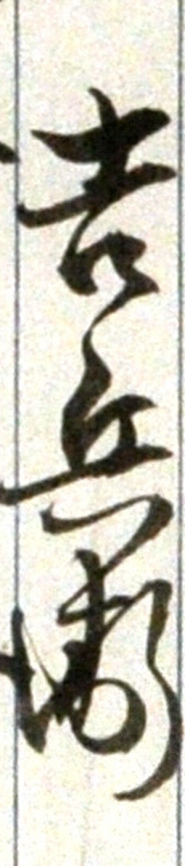吉兵衛
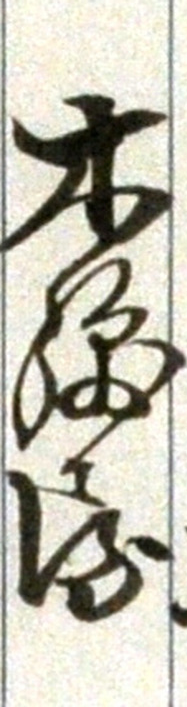木綿屋
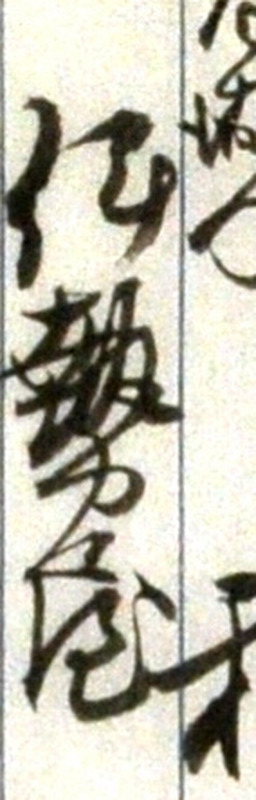伊勢屋
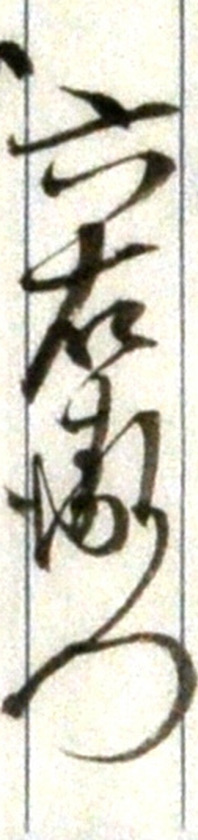甚右衛門
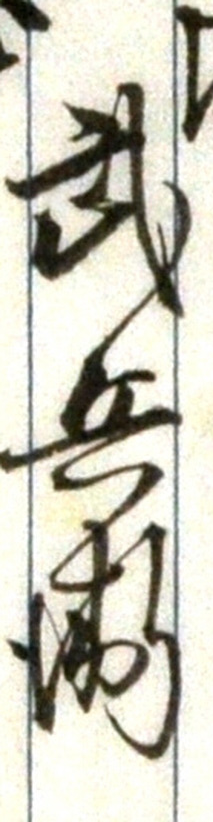吉兵衛
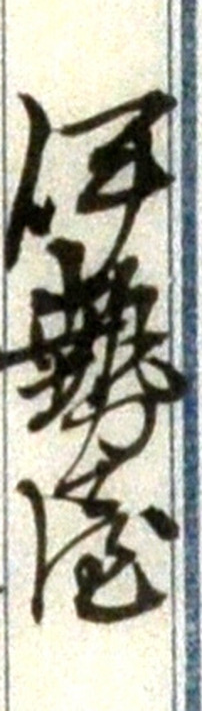伊勢屋
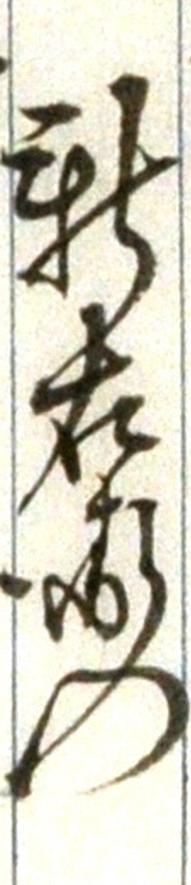甚右衛門
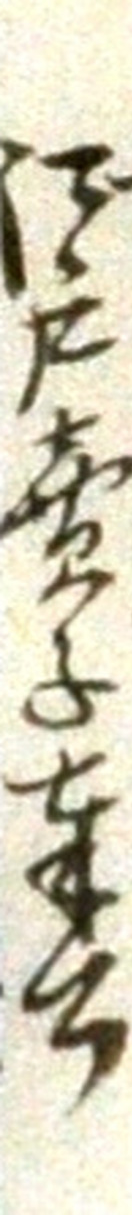江戸売子奉公
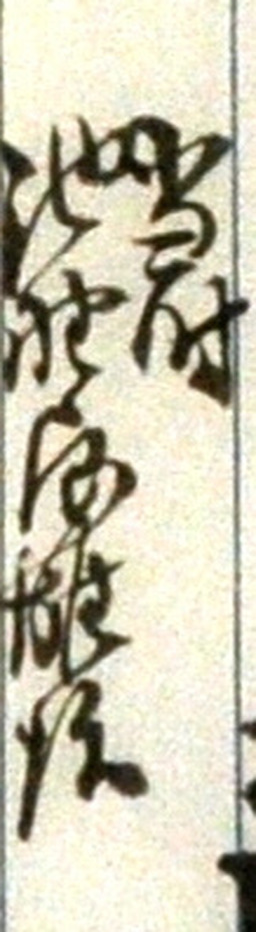池野屋雄治
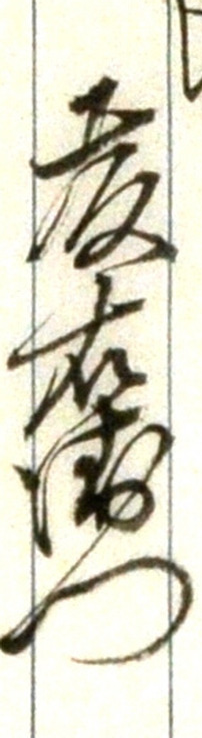甚右衛門
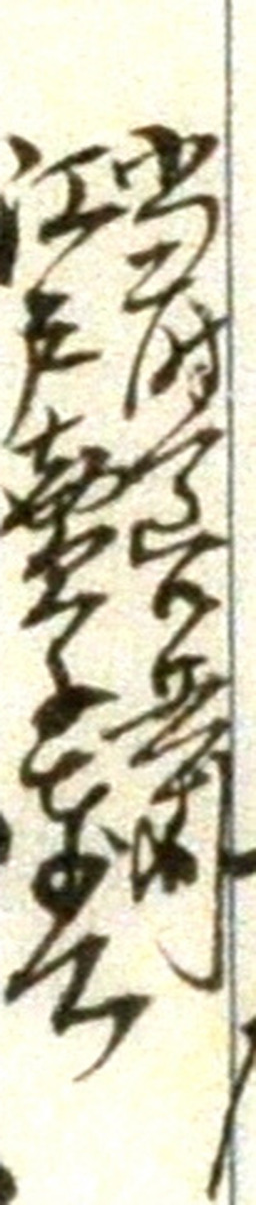江戸売子奉公

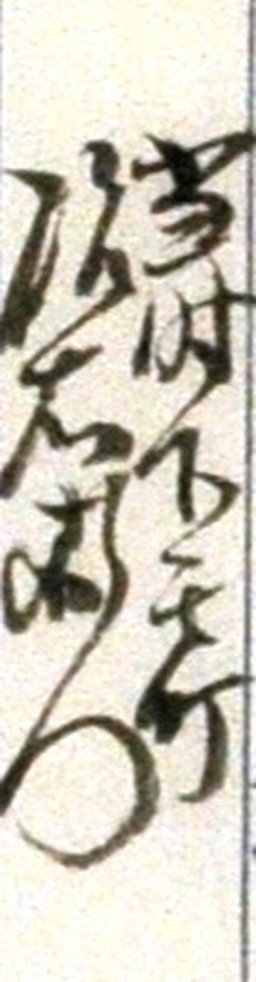治右衛門
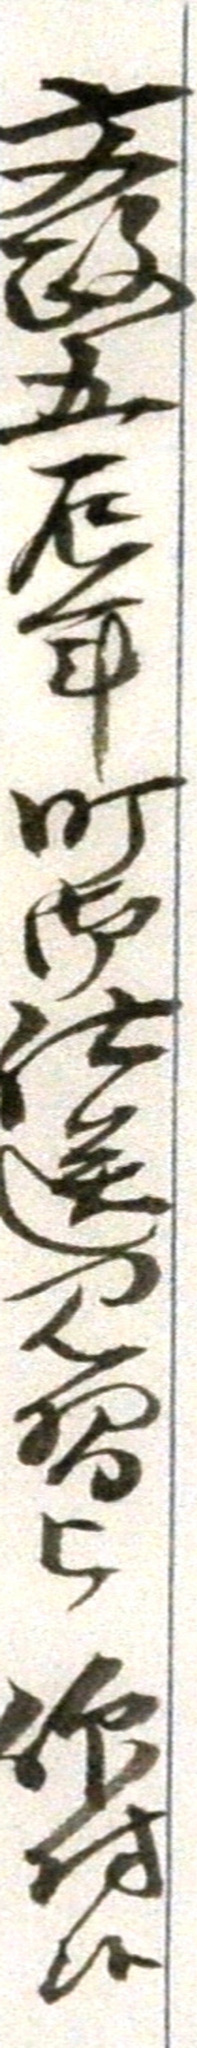文政五辰年町御仕送見習被仰付候
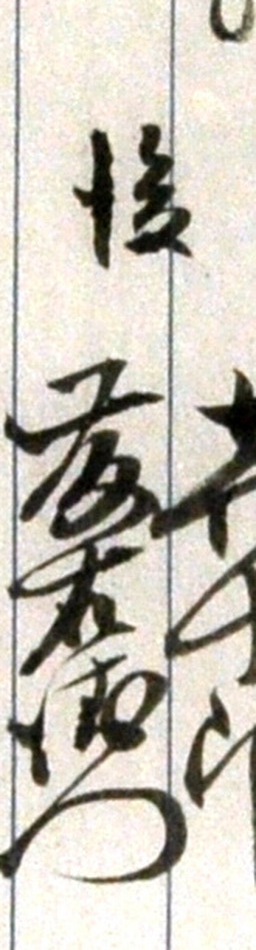後藤右衛門
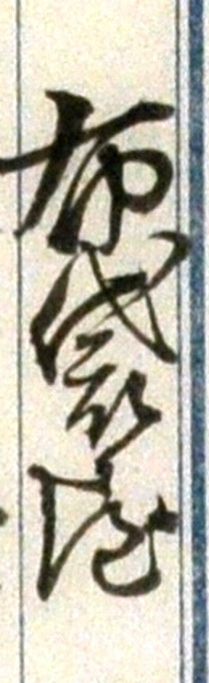布袋屋
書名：御拝地以来御用達相勤候者名前
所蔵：伊那市立高遠町図書館・合同会社AMANE
